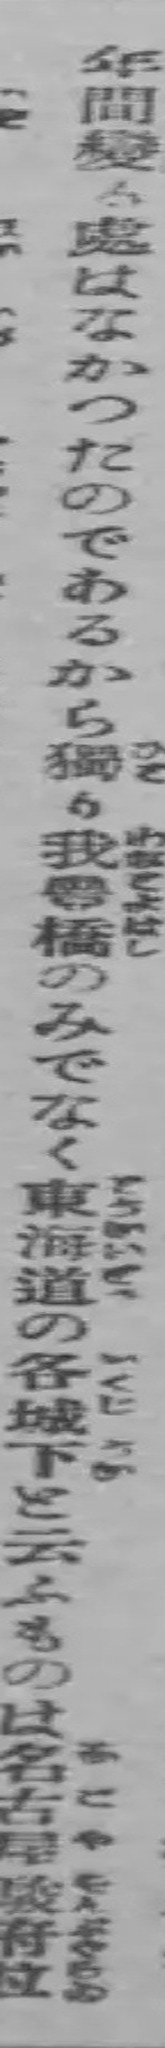年間変る処はなかつたのであるから独り我豊橋のみでなく東海道の各城下と云ふものは名古屋駿府位
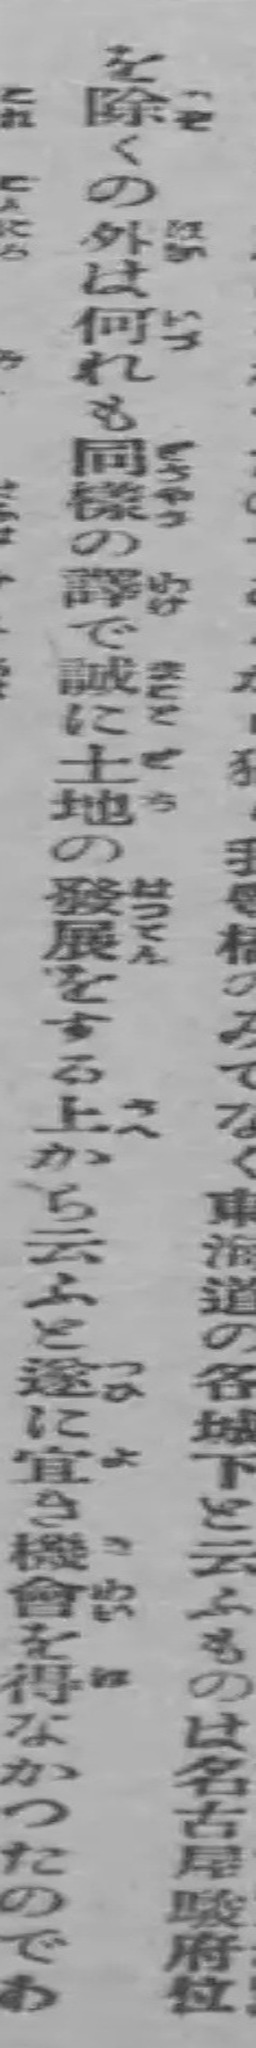を除くの外は何れも同様の訳で誠に土地の発展をする上から云ふと遂に宜き機会を得なかつたのであ
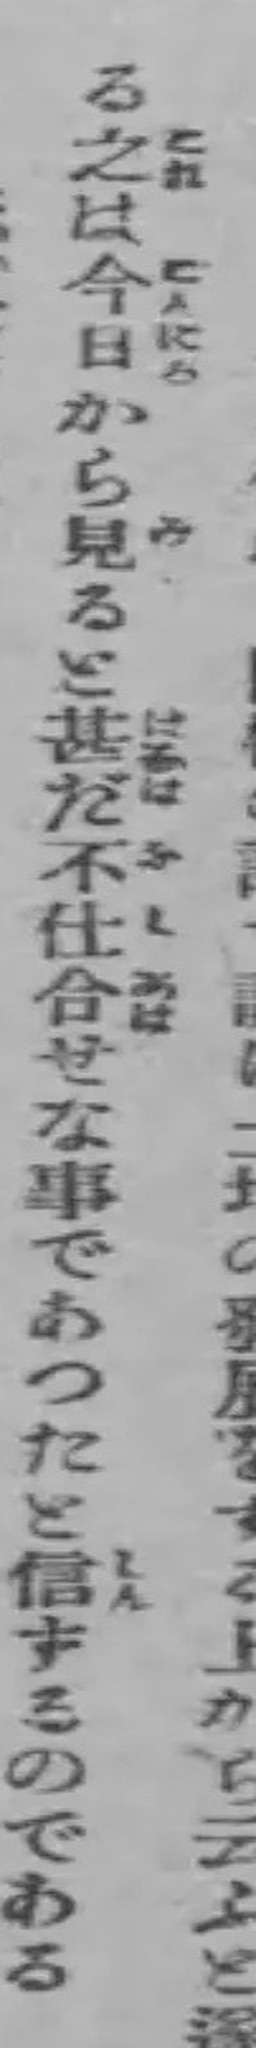る之は今日から見ると甚だ不仕合せな事であつたと信ずるのである
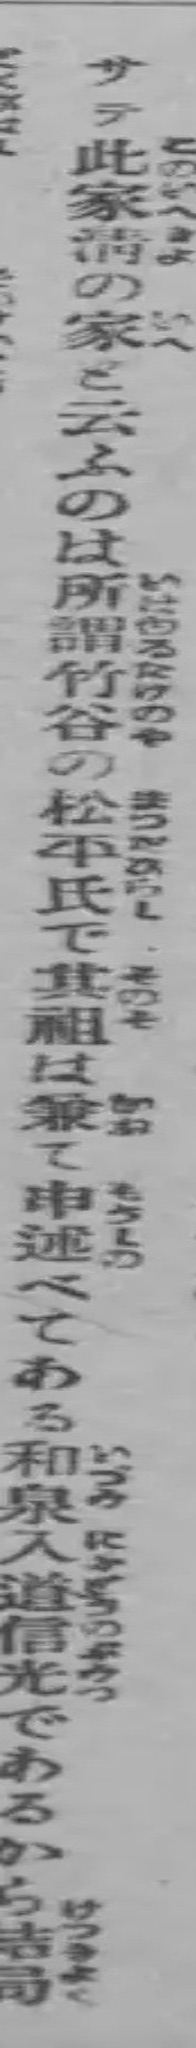竹谷の松平サテ此家清の家と云ふのは所謂竹谷の松平氏で其祖は兼て申述べてある和泉入道信光であるから結局
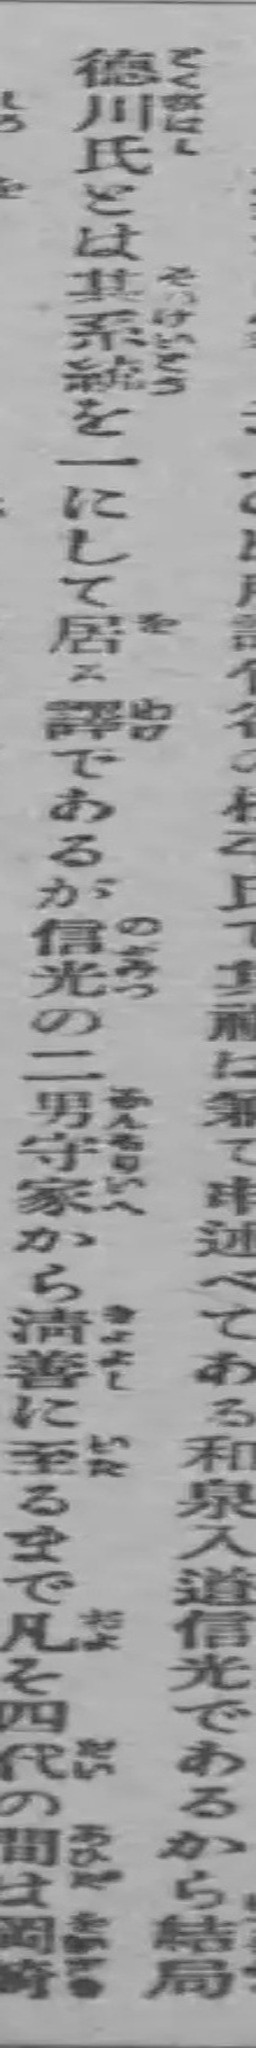徳川氏とは其系統を一にして居る訳であるが信光の二男守家から清喜に至るまで凡そ四代の間は岡崎
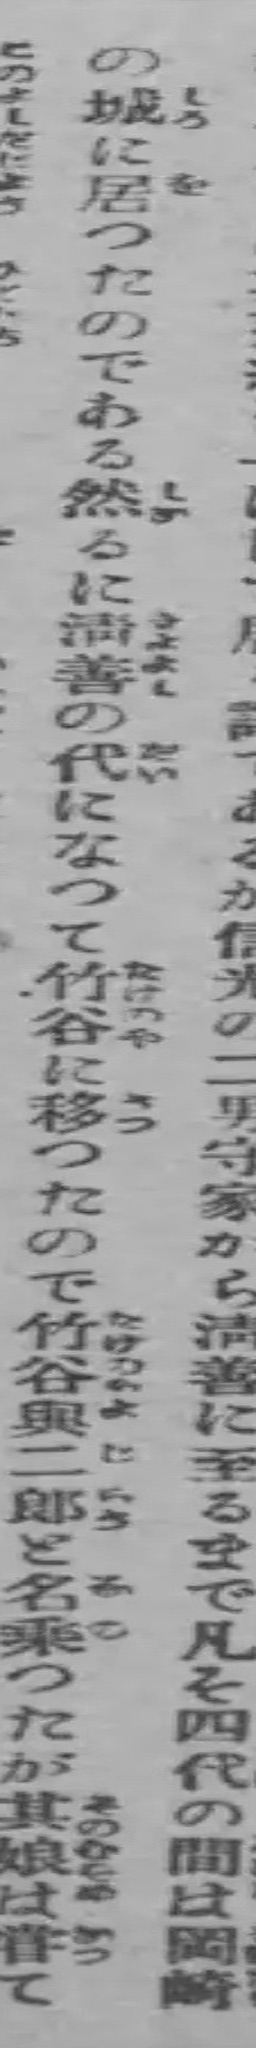の城に居つたのである然るに清喜の代になつて竹谷に移つたので竹谷與二郎と名乗つたが其娘は嘗て
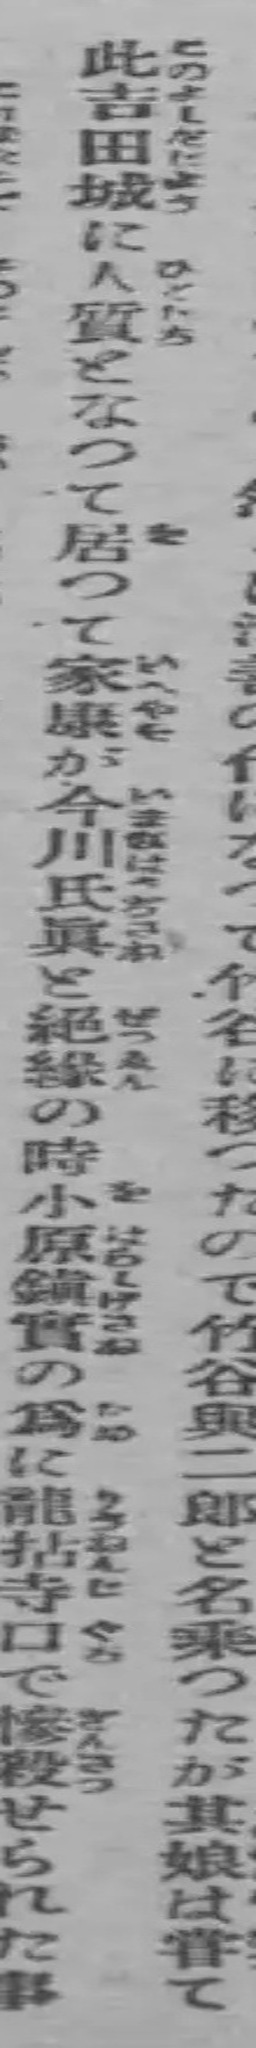此吉田城に人質となつて居つて家康が今川氏真と絶縁の時小原鎮実の為に龍拈寺口で惨殺せられた事
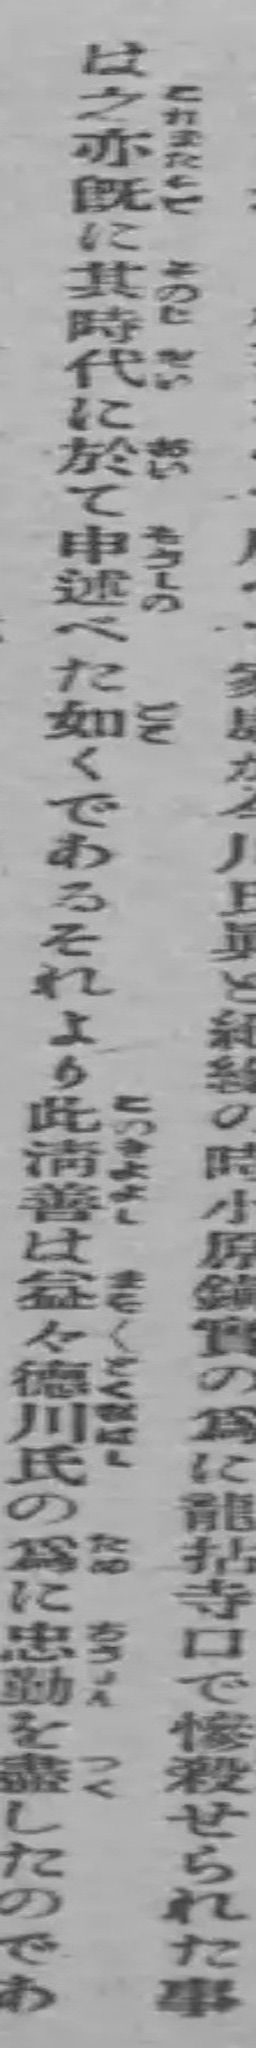は之亦既に其時代に於て申述べた如くであるそれより此清喜は益々徳川氏の為に忠勤を尽したのであ
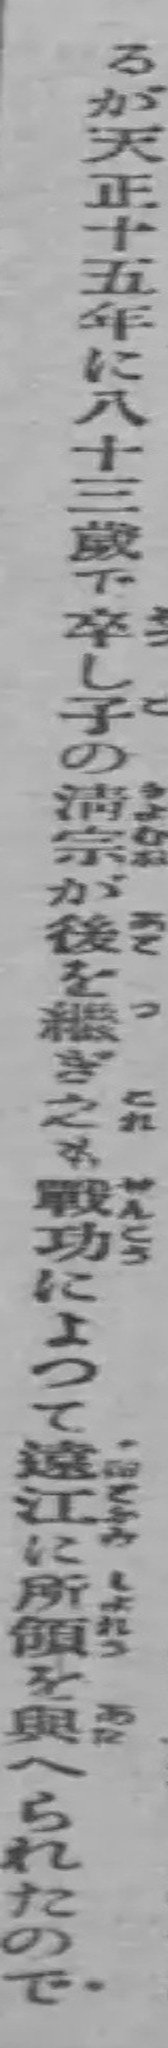るが天正十五年に八十三歳で卒し子の清宗が後を継ぎ之も戦功によつて遠江に所領を与へられたので
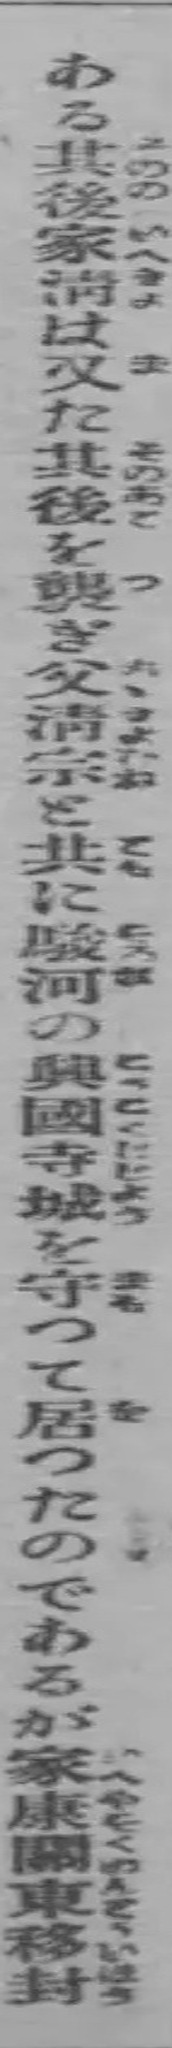ある其後家清は又た其後を襲ぎ父清宗と共に駿河の興国寺城を守つて居つたのであるが家康関東移封
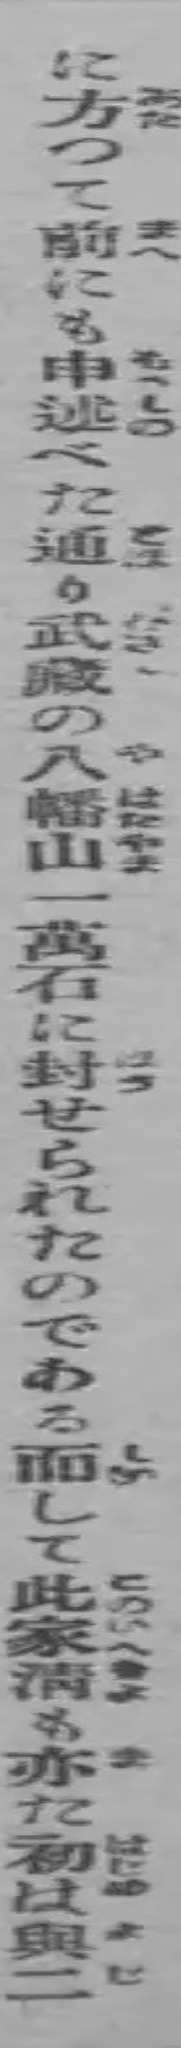に方つて前にも申述べた通り武蔵の八幡山一万石に封せられたのである而して此家清も亦た初は與二
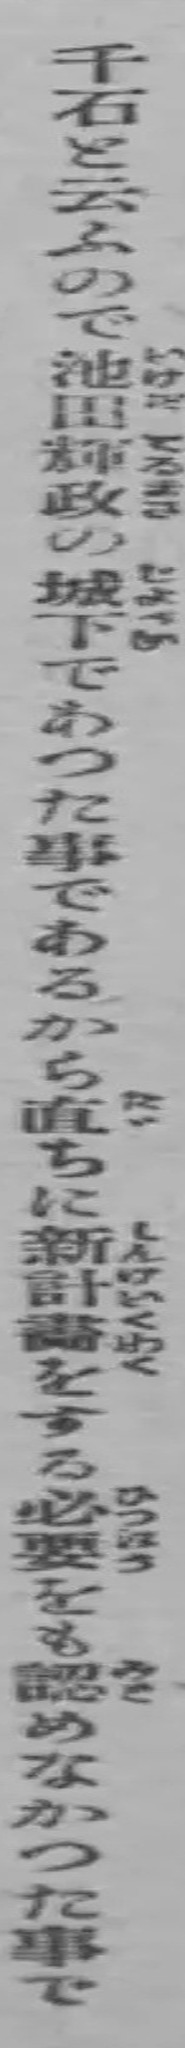千石と云ふので池田輝政の城下であつた事であるから直ちに新計画をする必要をも認めなかつた事で
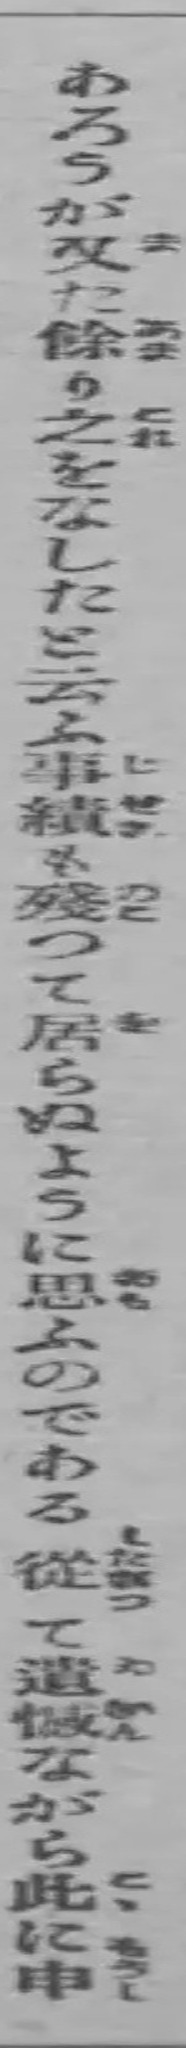あろうが又た余之をなしたと云ふ事績も残つて居らぬように思ふのである従て遺憾ながら此に申
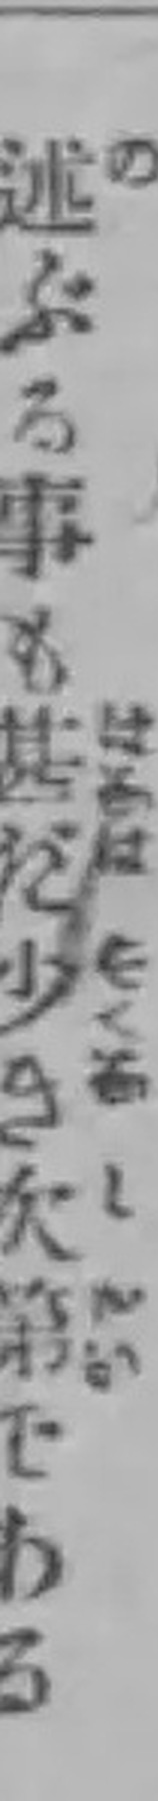述ぶる事も甚だ少き次第である
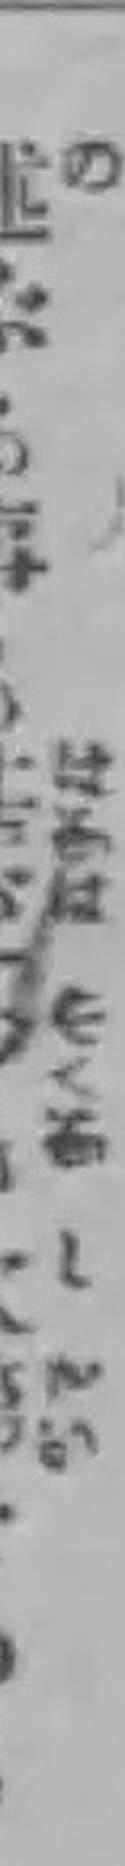述ぶる事も甚だ少き次第である
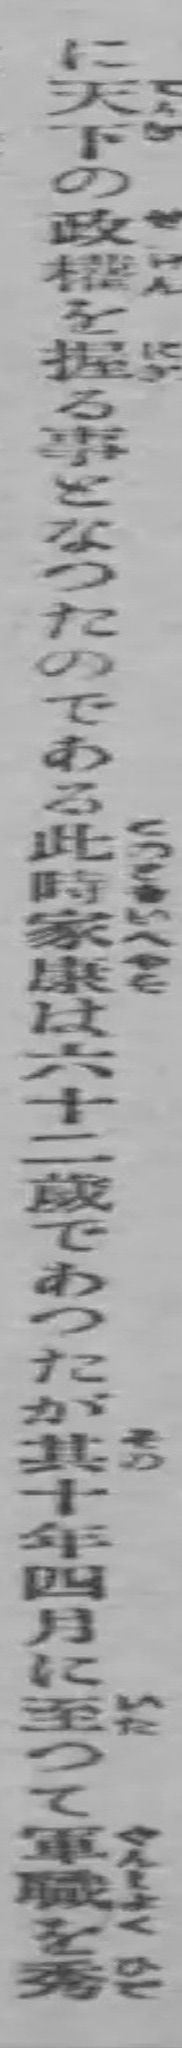らるに天下の政権を握る事となつたのである此時家康は六十二歳であつたが其十年四月に至つて軍職を秀
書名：豊橋市史談
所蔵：国立国会図書館 National Diet Library, JAPAN
